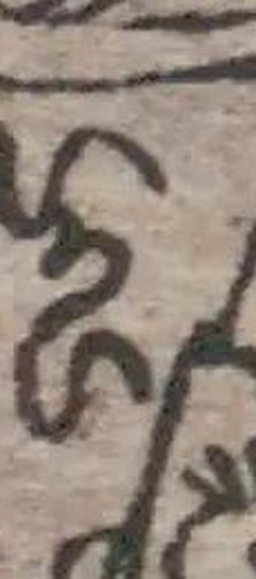いかい
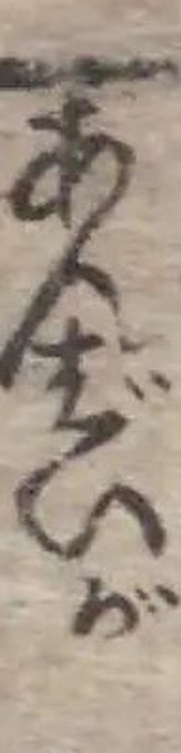あんばいが
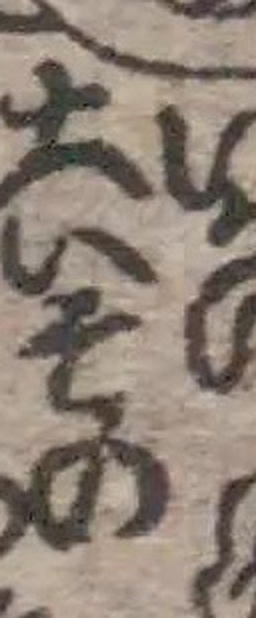大いその
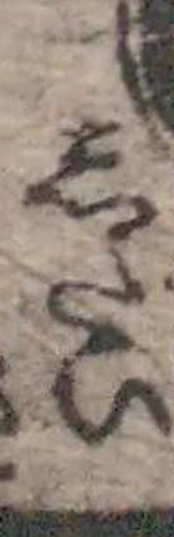しだい

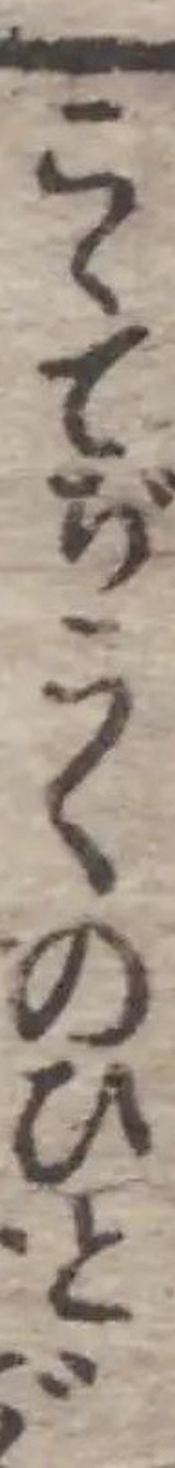こゝてぢこくのひと
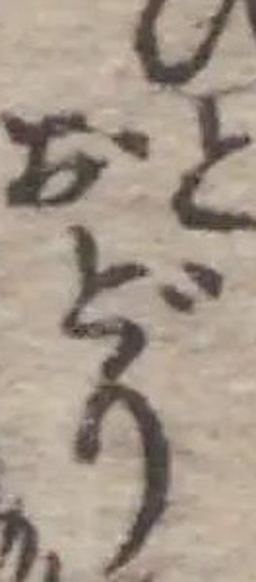おどり
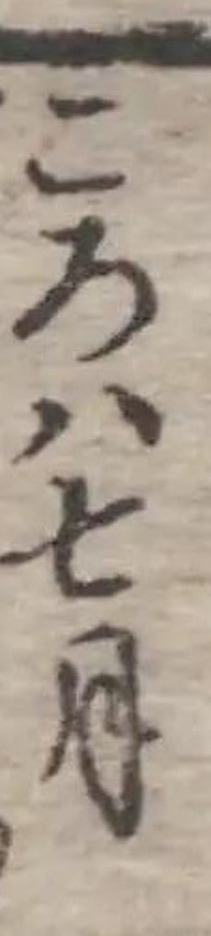ころは七月
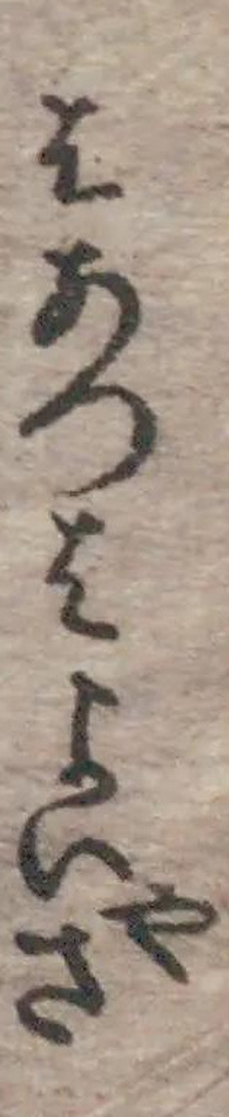はあつはよいやさ
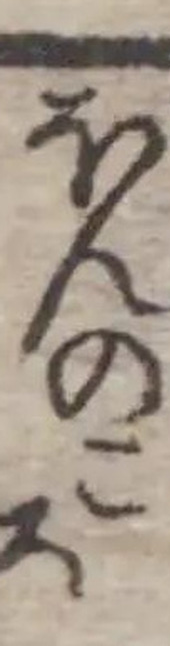ぼんのころ
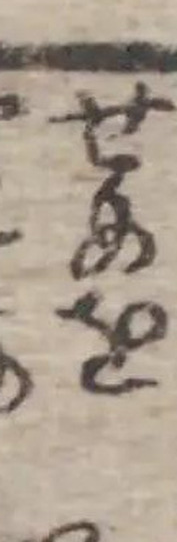せめを
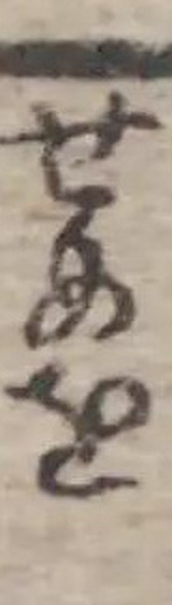せめを
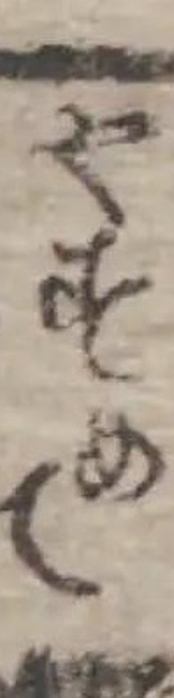やすめて
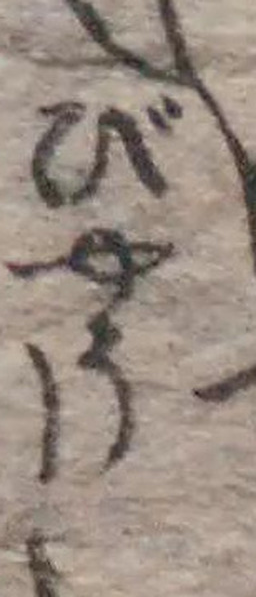びやう
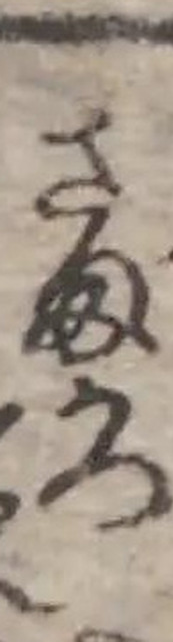さまかつ
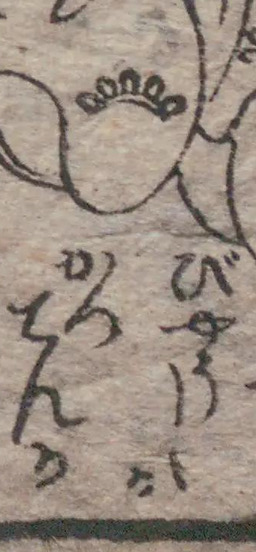てんか
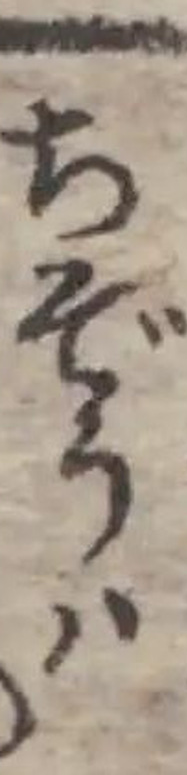ちぞうは
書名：大磯地蔵咄 2巻
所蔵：国立国会図書館 National Diet Library, JAPAN
